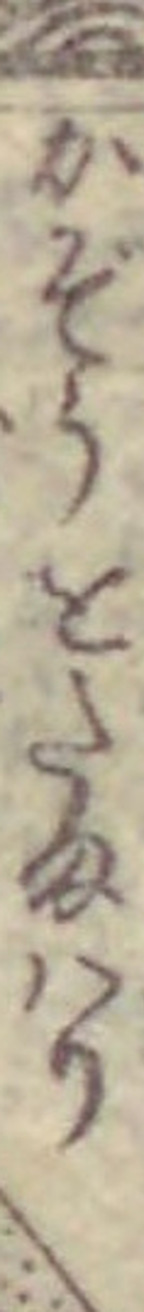かぞうをたまはり
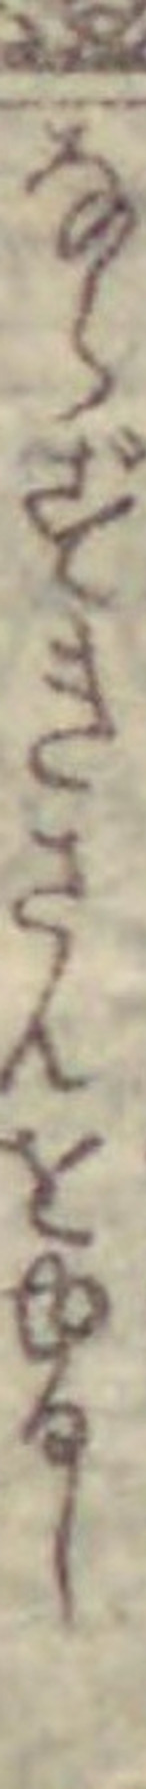ならずきさんをゆるし
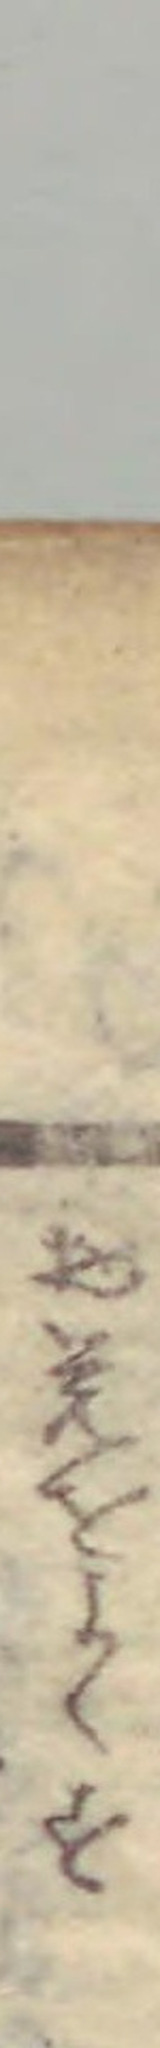物覚をよくす
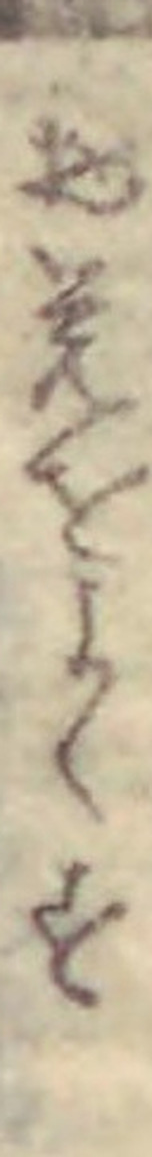物覚をよくす
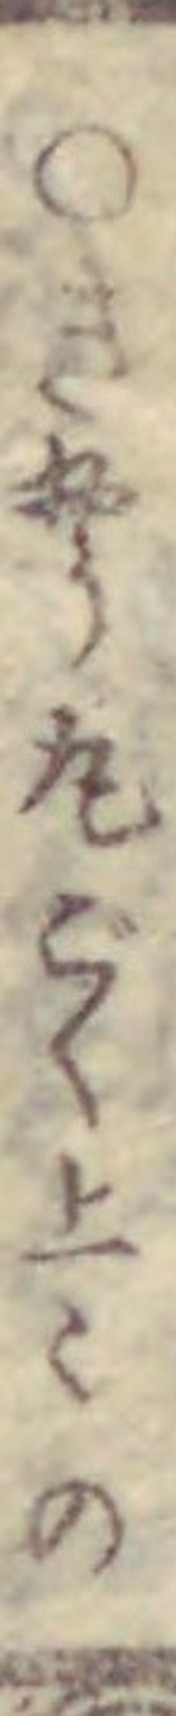○きおう丸ごく上々の
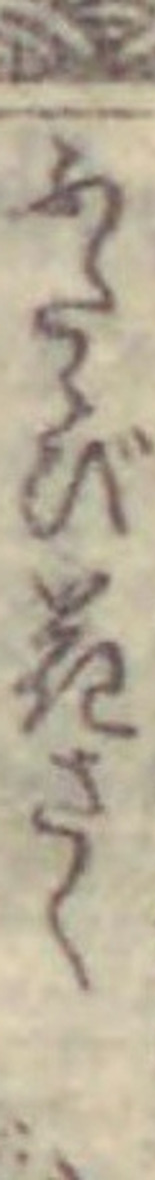ふたゝび花さく
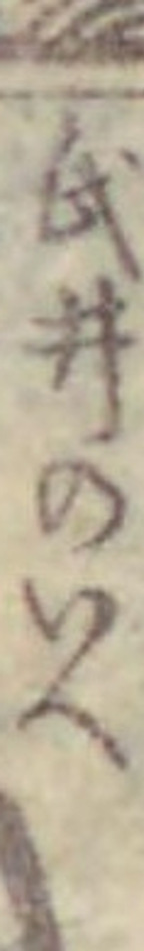氏井のいへ
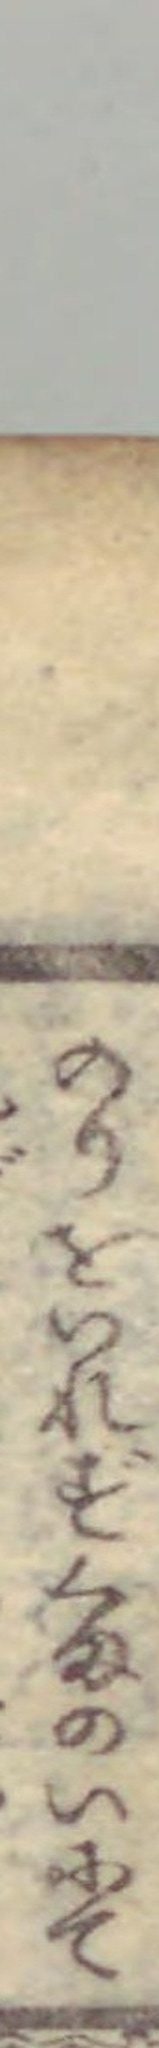のりをいれずくまのいにて
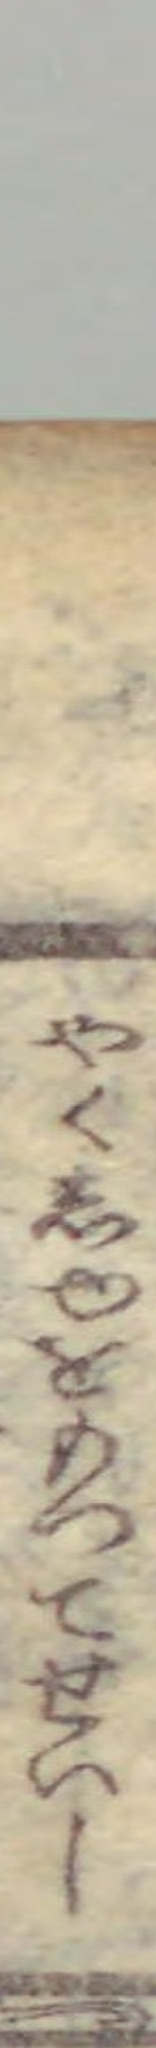やくしゆをもつてせいし
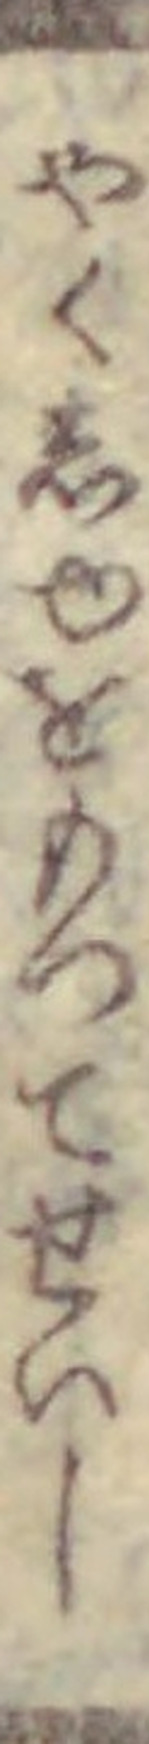やくしゆをもつてせいし
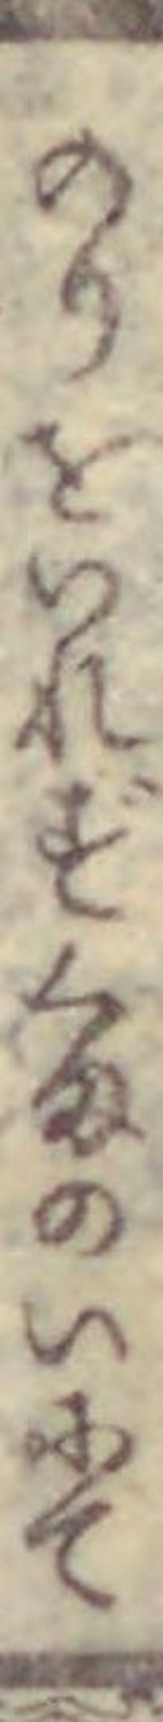のりをいれずくまのいにて
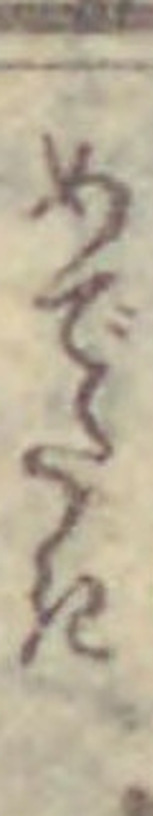めでたき
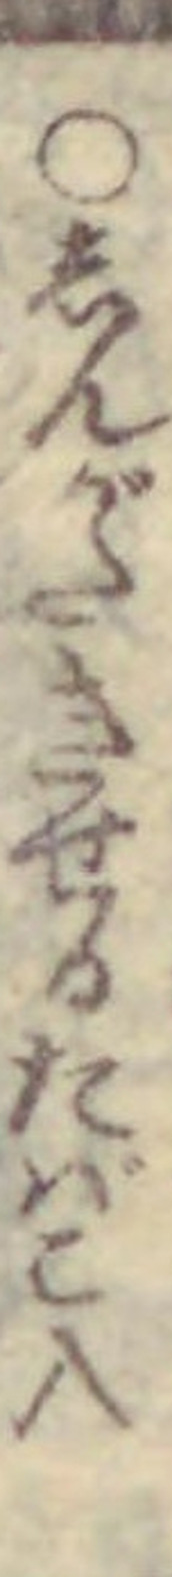○しんがたきせるたばこ入
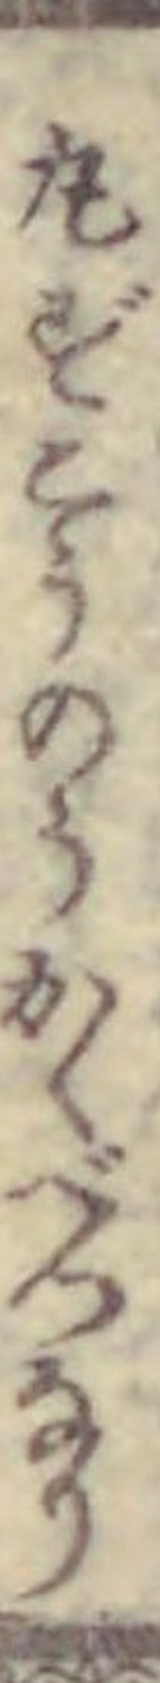丸ずこうのうかくべつなり
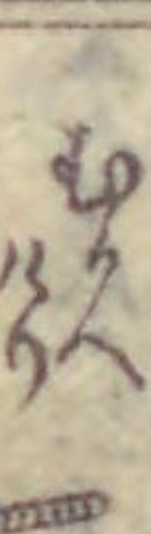むかへ
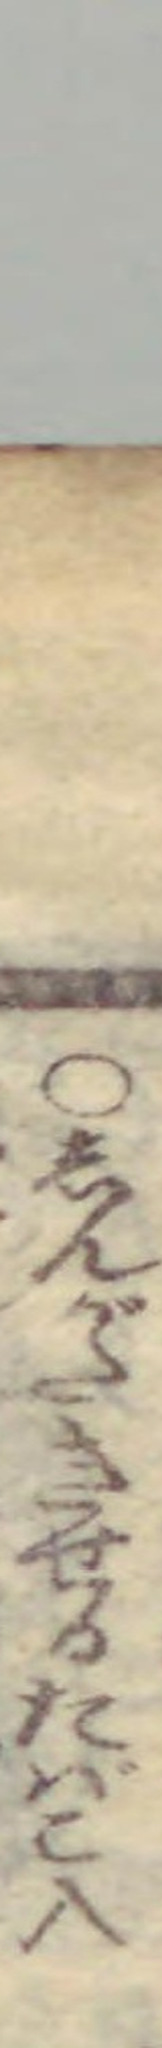○しんがたきせるたばこ入
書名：八ツ目鱣因縁物語 3巻
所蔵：国立国会図書館 National Diet Library, JAPAN
